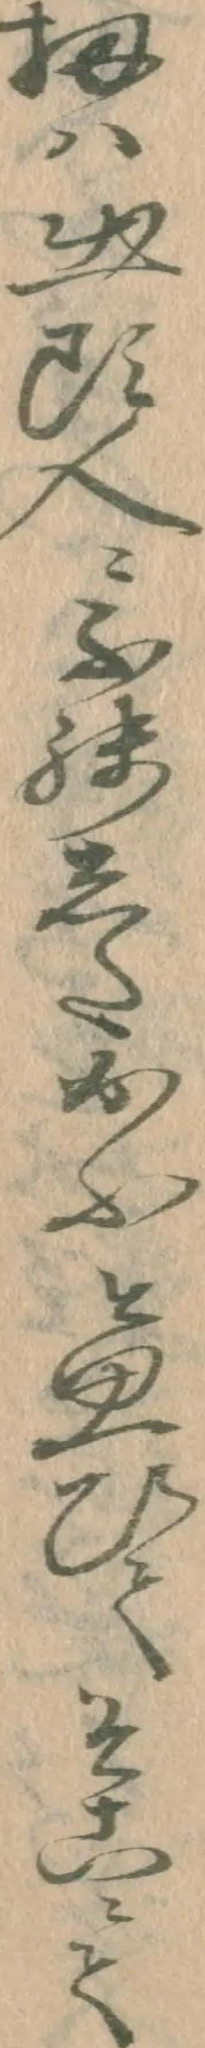扨は出頭人にふ残志たかふと思ひてそ古にて
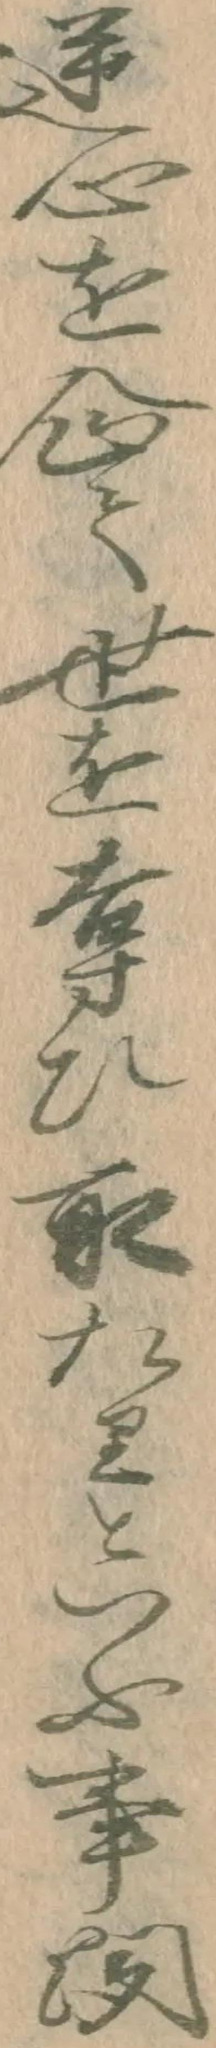逆心を企て世を奪ひ取た里といふ事聞
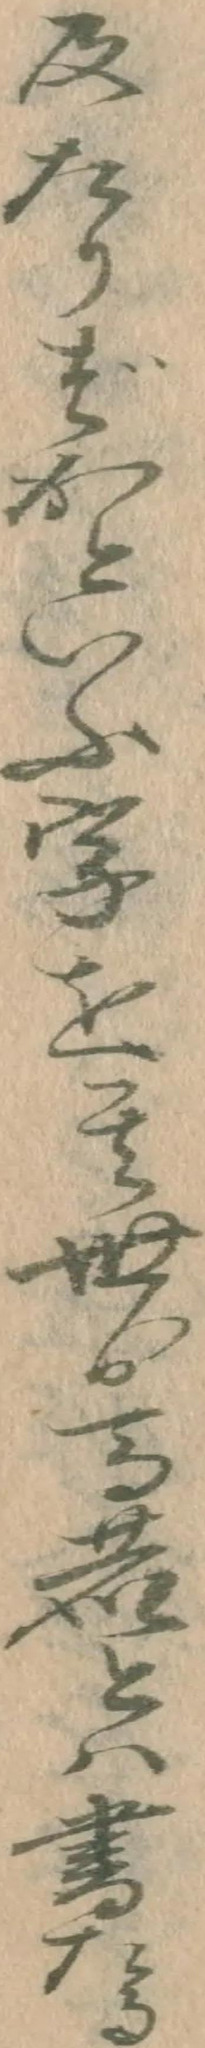及たりばかといふ字を其世より馬鹿とは書たる
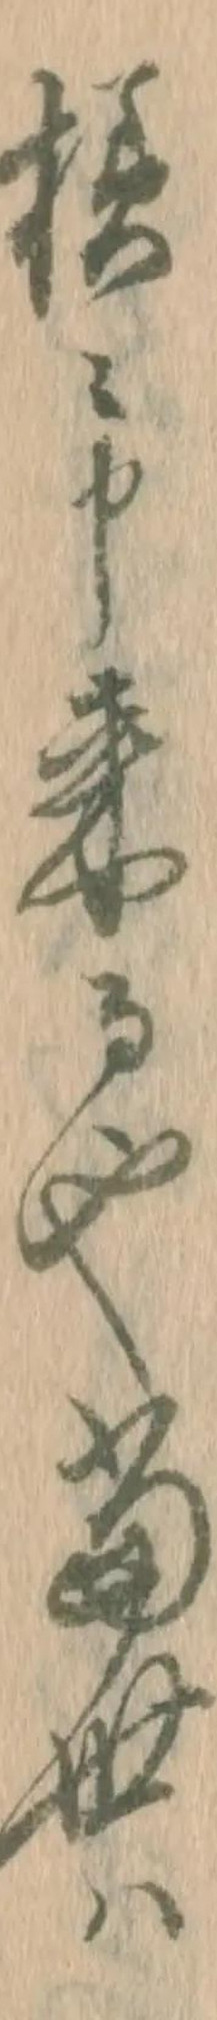様に申来るる也当世は
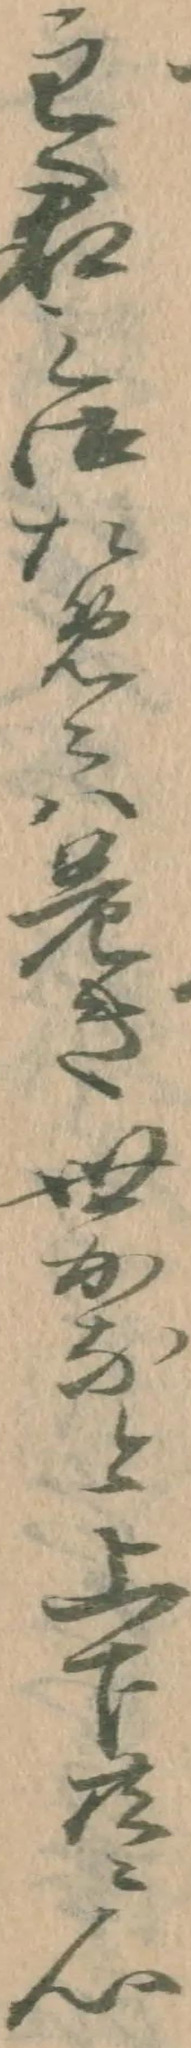主君之御た免には危き世かなと上下共に心
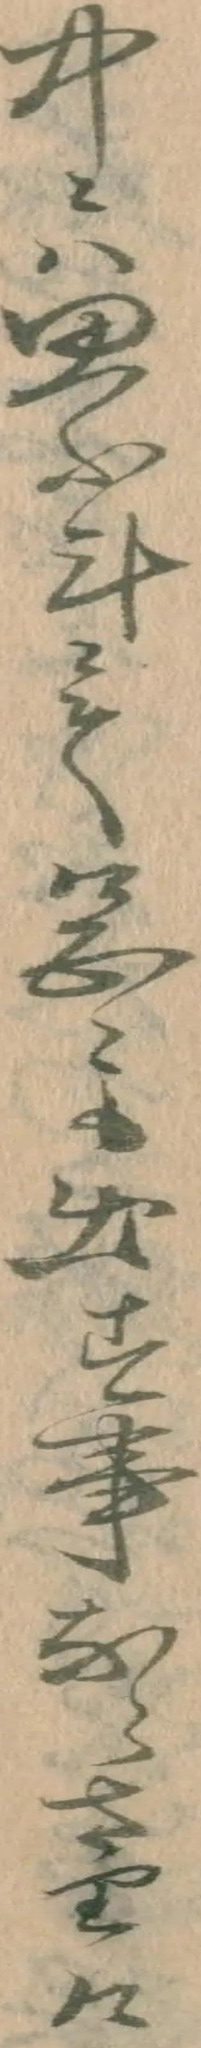中には思ふ斗にて色にも出春事ならさ里け

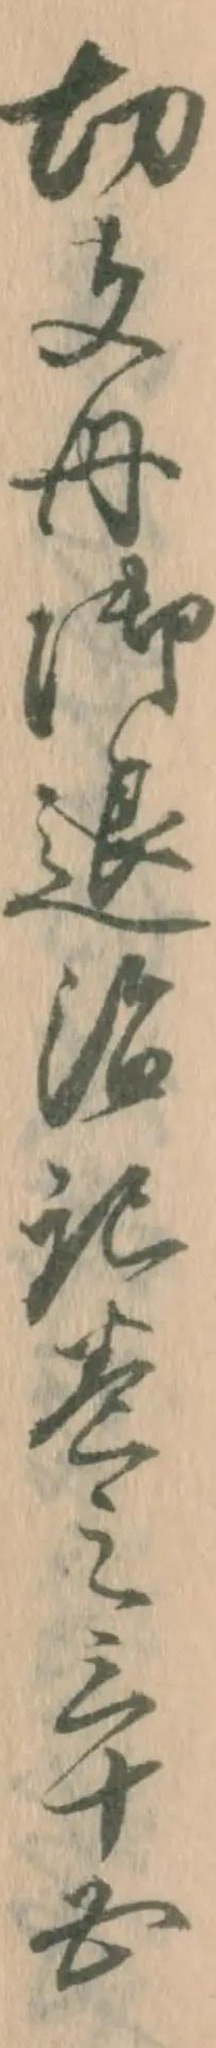切支丹御退治記巻之三十五
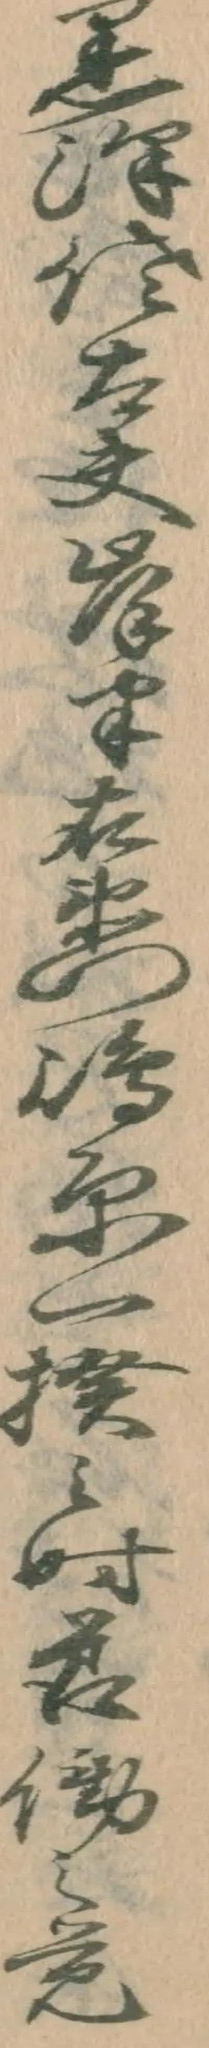黒沢左太夫岸半右衛門島原一揆之時節働之覚
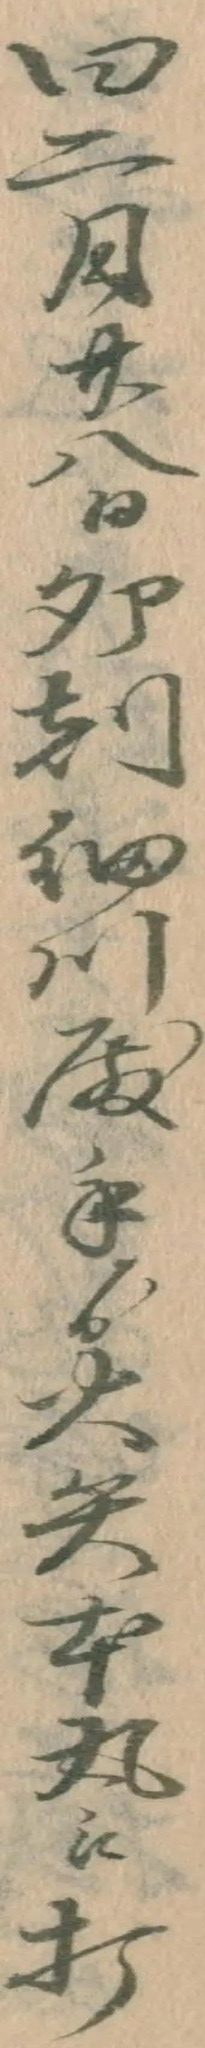曰二月廿八日夘刻細川殿手ゟ火矢火御丸江打
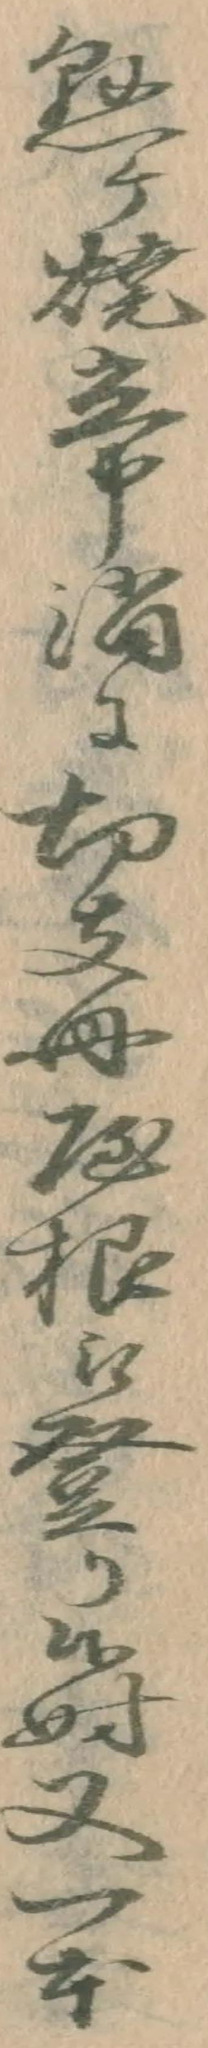懸け焼立申消尓切支丹屋根江登り候時又一本
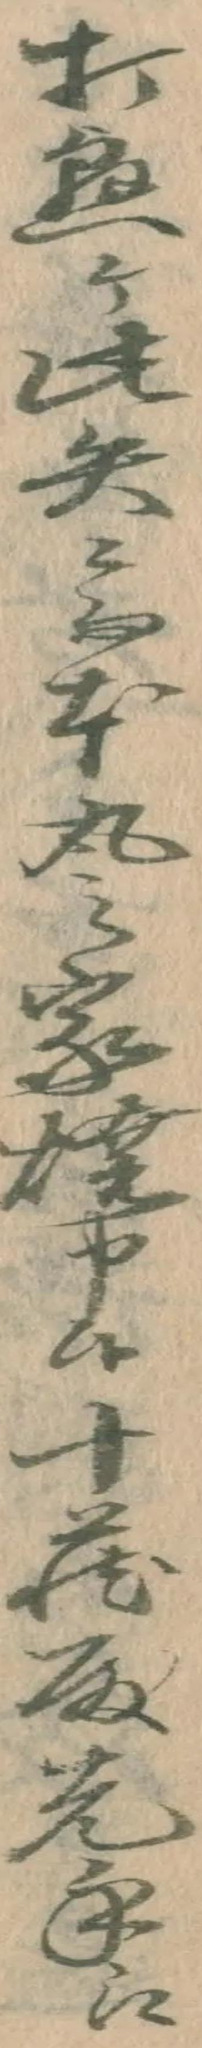打懸け此矢に而本丸之家焼申候十蔵殿先手江
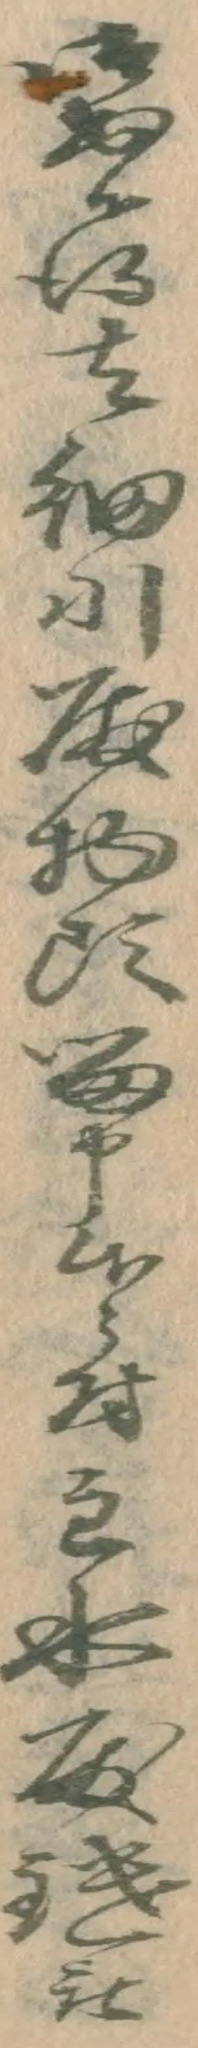御出候得者細川殿物頭留申候に付主水殿鑓被
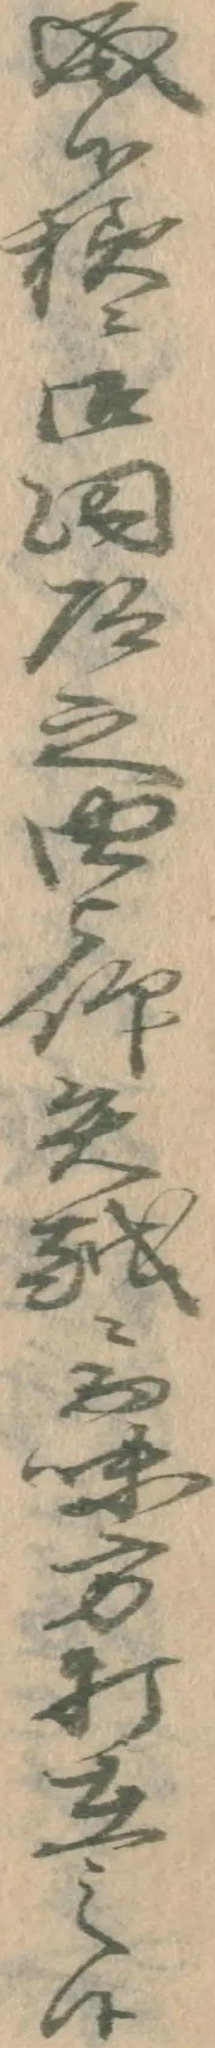成候様に御同道之由被仰矢越に而味方打在之候
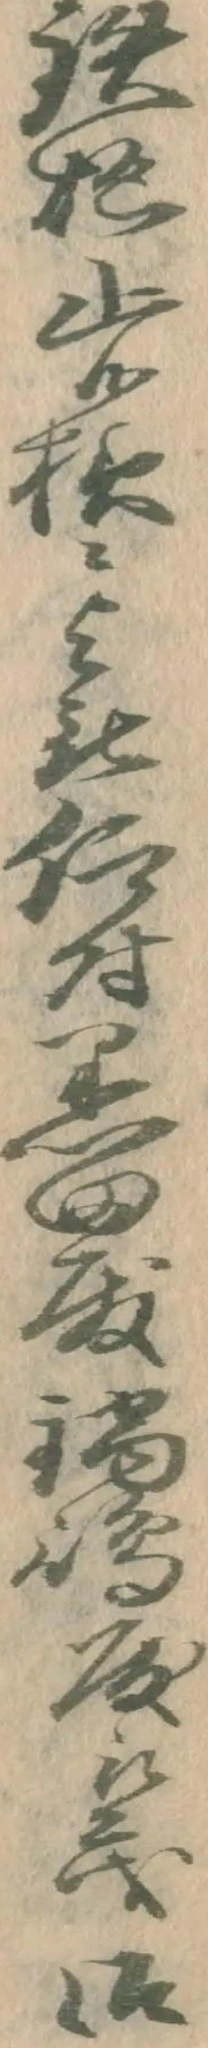鉄炮止候様に与被仰付黒田殿鍋島殿江茂御
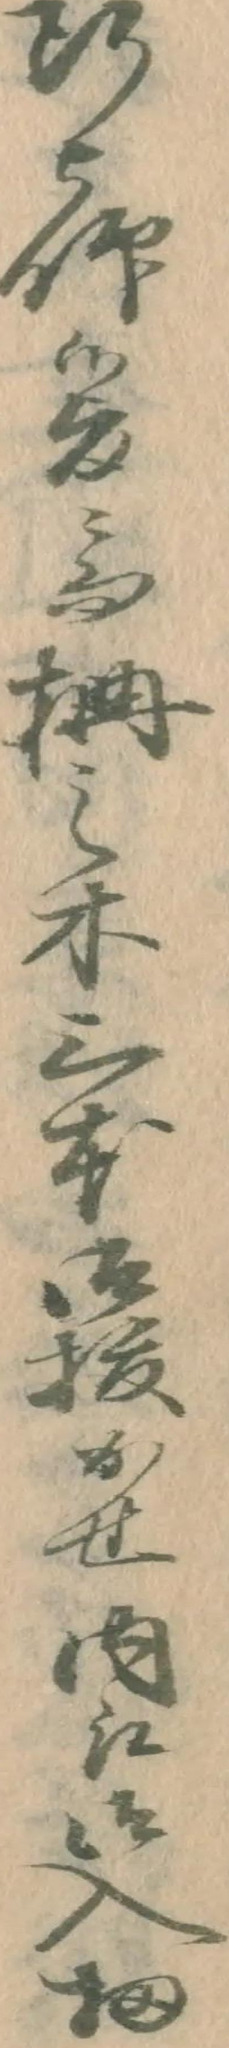断被仰候旨に而柵之木三本御抜かせ内江御入扨

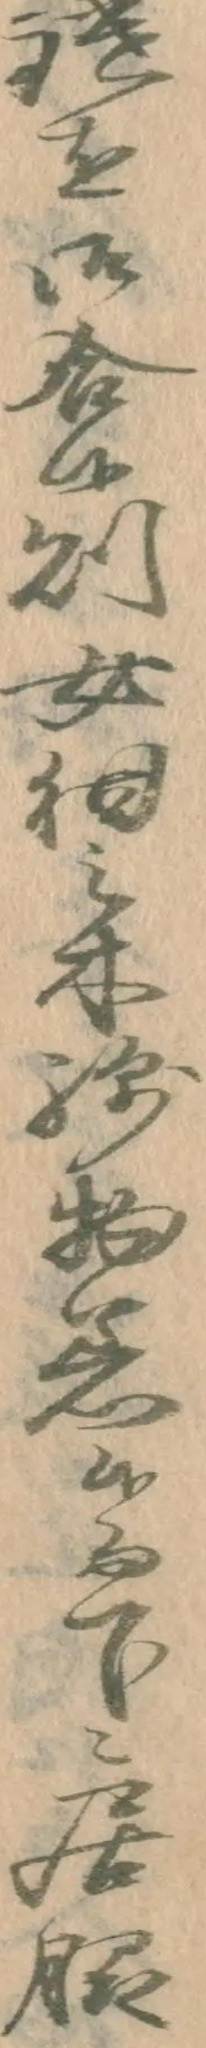鑓を御合候則女袖之木綿物着候而下に居脇
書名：切支丹御退治記 49巻. [8]
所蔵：国立国会図書館 National Diet Library, JAPAN
